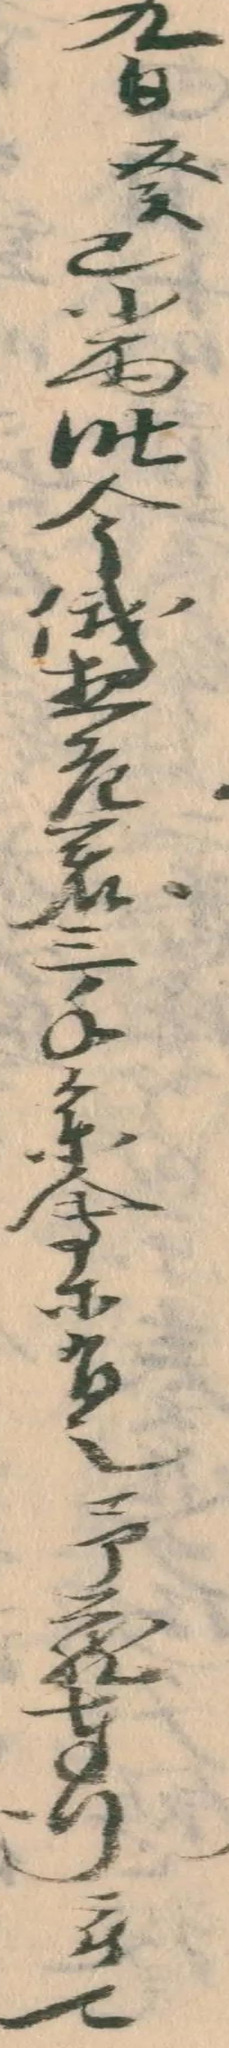九日癸巳小雨昨今俄惣老若三手参會等有之予蔵奉行ニ付可
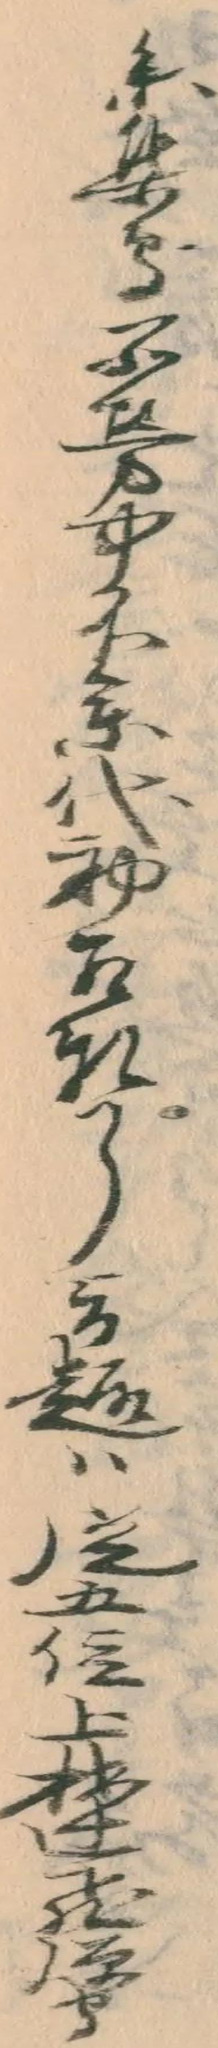参集處所労中不参代勤相願了旨趣ハ従五位上梅辻飛騨守
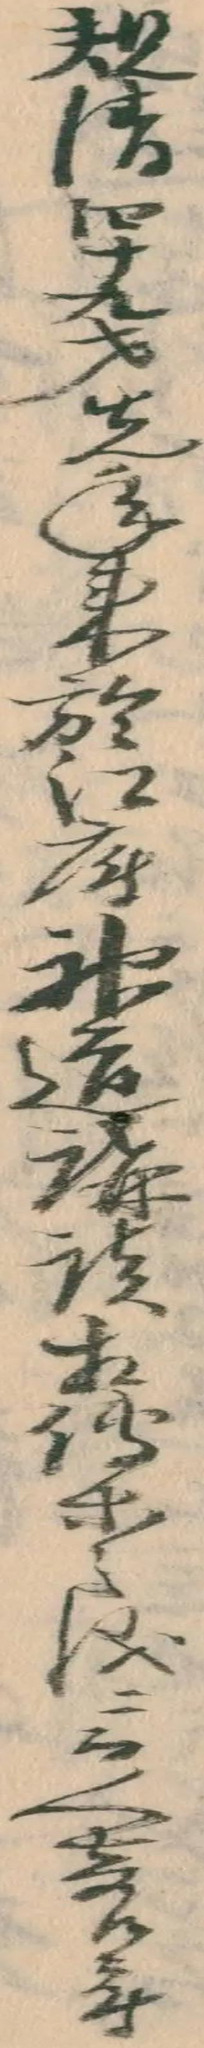規清四十九才先年来於江府神道講談相傳等之儀ニ而人寄候ニ付
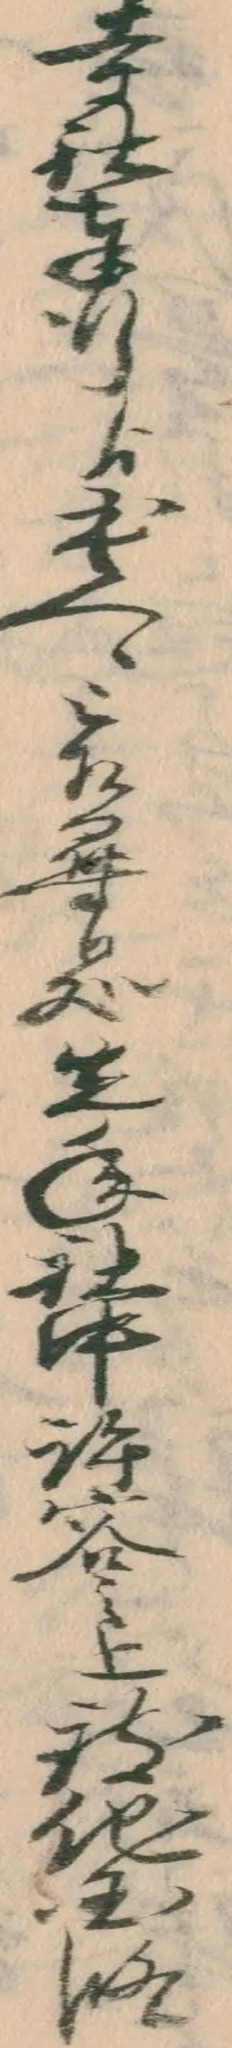寺社奉行ゟ本人へ被相尋候処先年社中許容之上致他国修
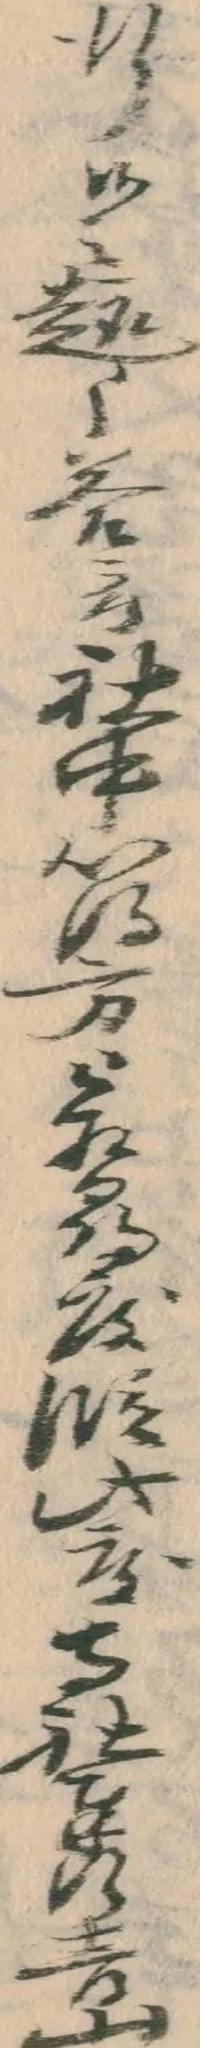行候之趣申答ニ付社中心得方被相尋度段此度寺社奉行青山
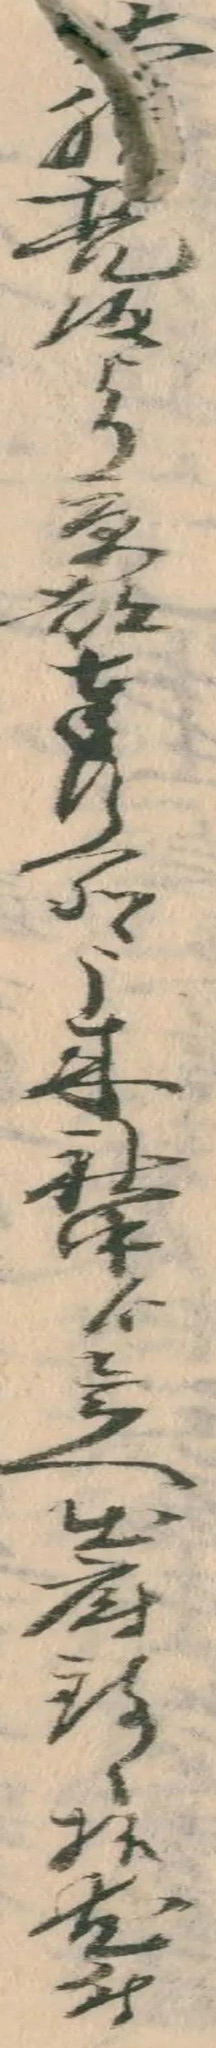大膳亮殿より京都奉行所へ申来社中ゟ壱人出府致候様尤付
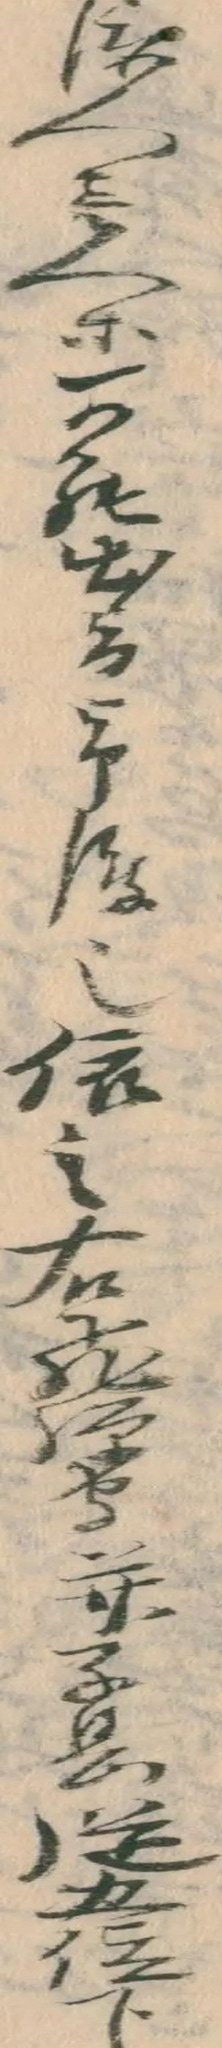添人壱人等可罷出旨被申渡也依之右飛騨守并子息従五位下
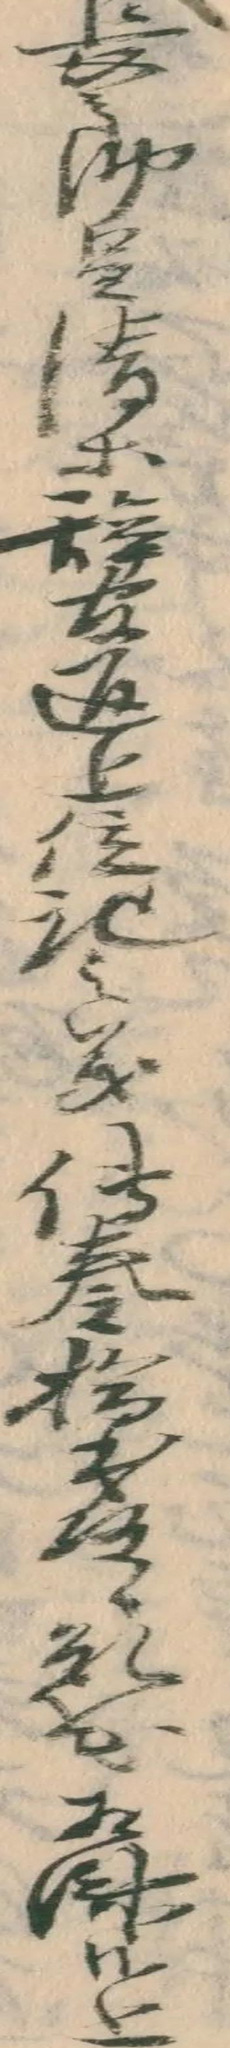長之助呈清等辞官返上位記之義傳奏橋本殿ヘ願出相済候上
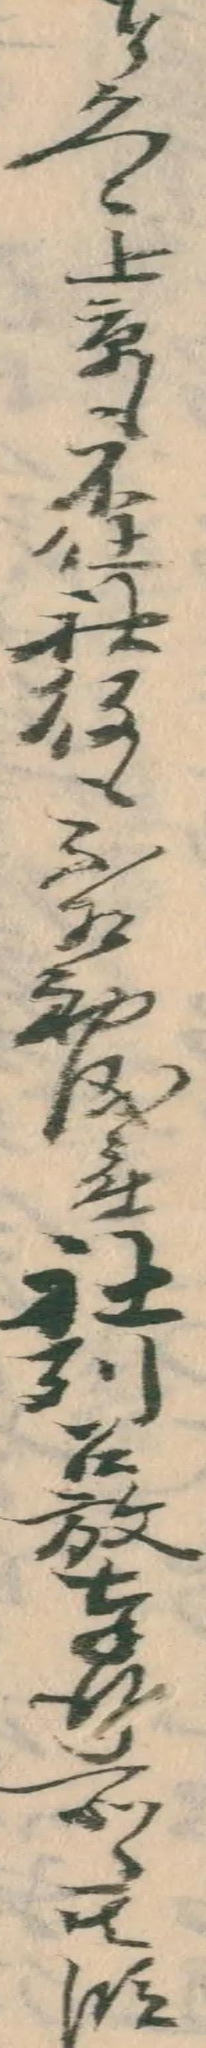奉久候上京も不仕社役も不相勤儀ニ付社列召放奉行所ヘ其段
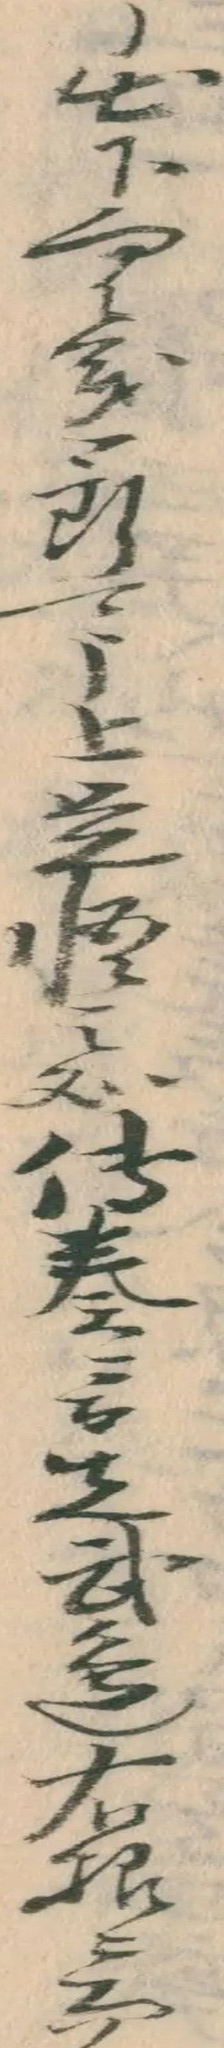申出下向之義御断可申上覚悟之処傳奏ニ而先武邊右様ニ而
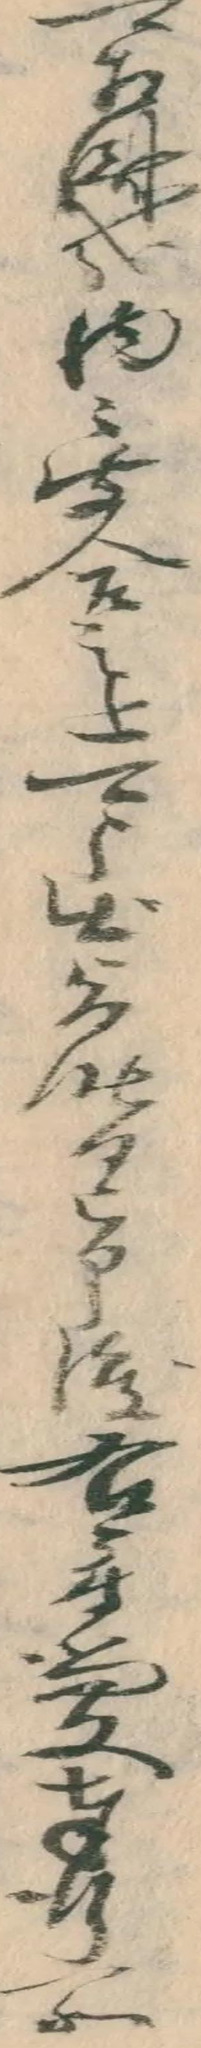可相済哉内々聞合之上可申出旨昨日被申渡右ニ付尚又奉行所
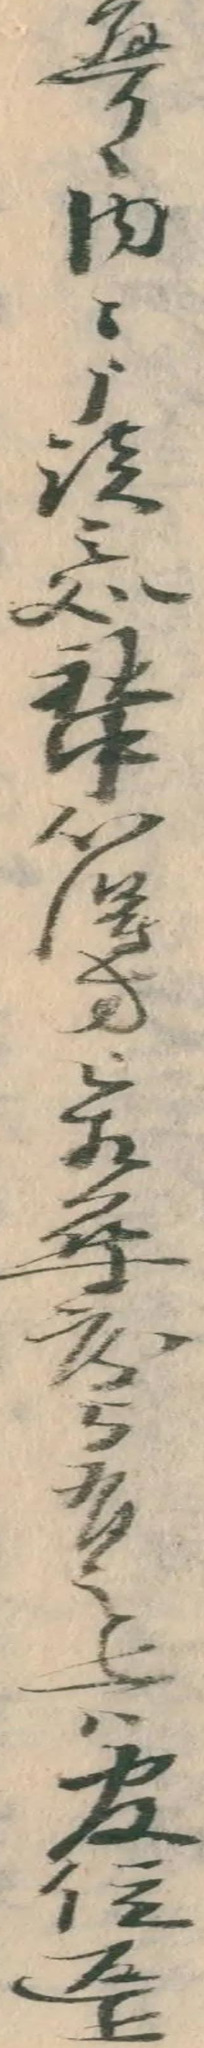懸リニ内々申談之処社中心得方被相尋度と有之上ハ官位返上
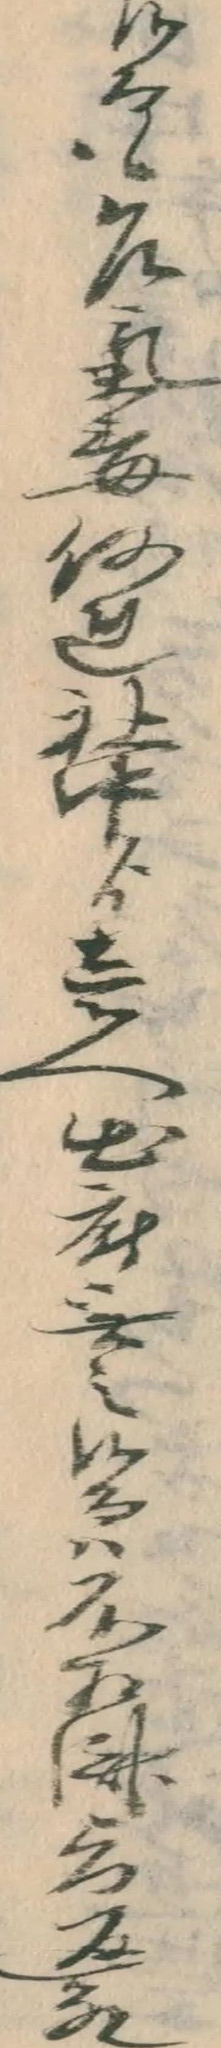候而も乍氣毒何れ社中ゟ壱人出府無之候而ハ不相済旨返答
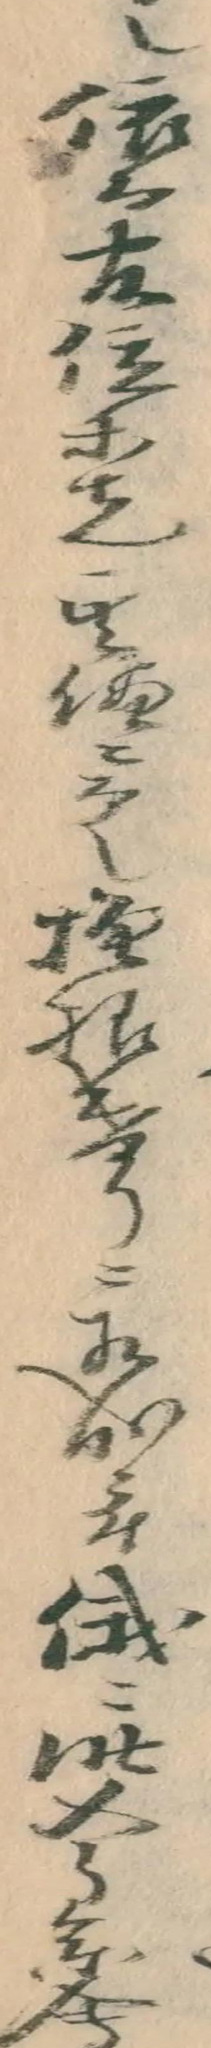之依而官位等先其侭ニ而之模様替りに相成ニ付俄に昨今参會

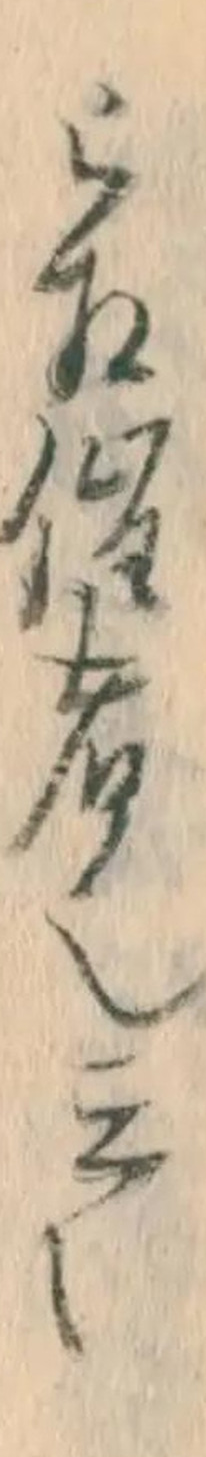被相催者也云々
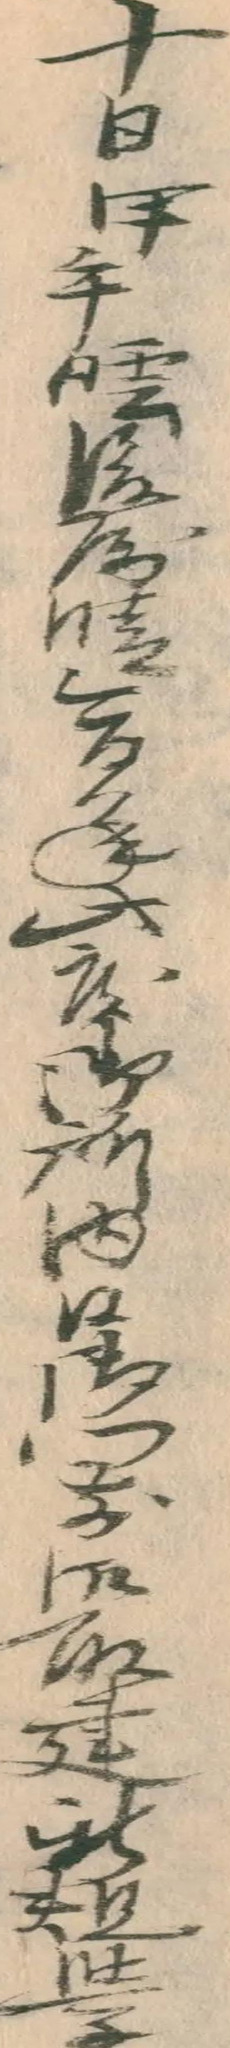十日甲午曇後属晴今日年此度御所内殿御門前御取建新規學
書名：賀茂社記録. 第70冊
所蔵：国立国会図書館 National Diet Library, JAPAN
